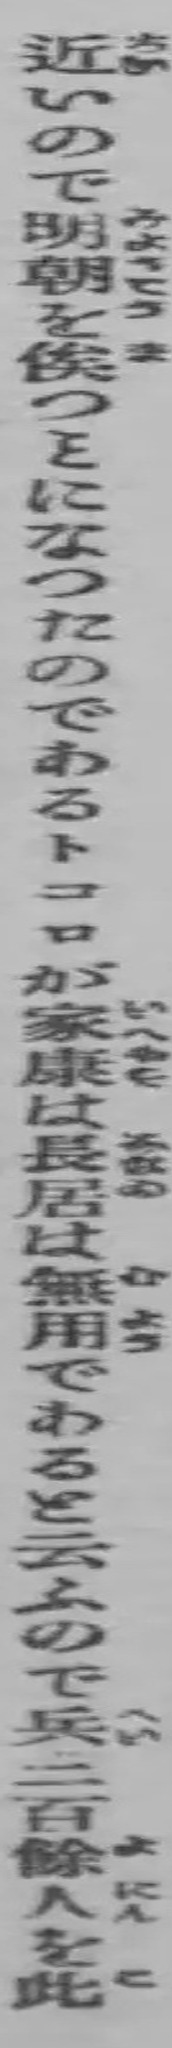近いので明朝を俟つことになつたのであるトコロが家康は長居は無用であると云ふので兵二百余人を此
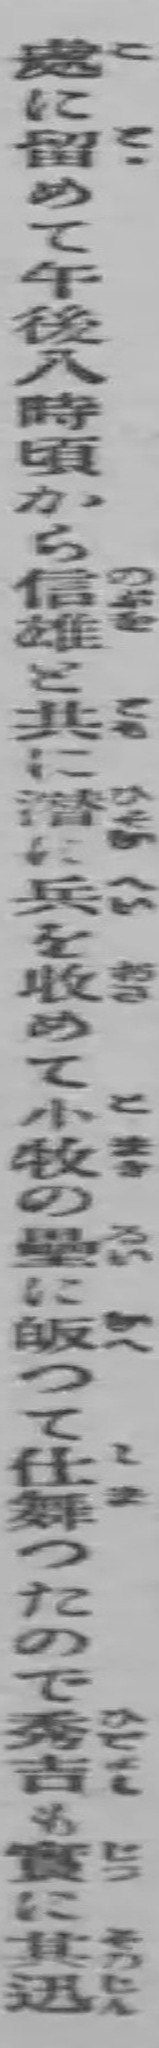処に留めて午後八時頃から信雄と共に潜に兵を収めて小牧の塁に皈つて仕舞つたので秀吉も実に其迅
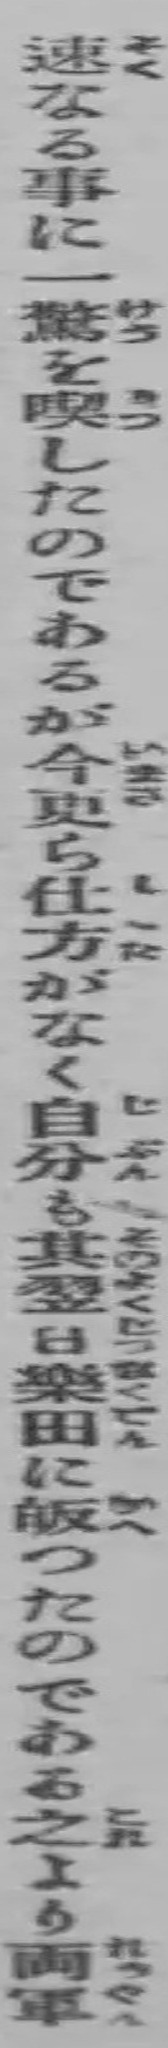速なる事に一驚を喫したのであるが今更ら仕方がなく自分も其翌日楽田に皈つたのである之より両軍
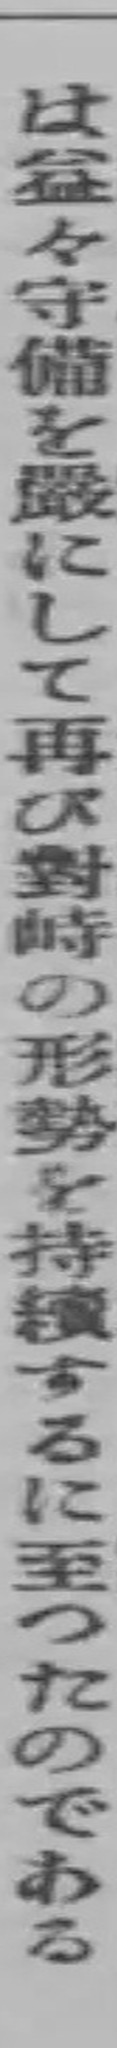は益々守備を厳にして再び対峙の形勢を持続するに至つたのである
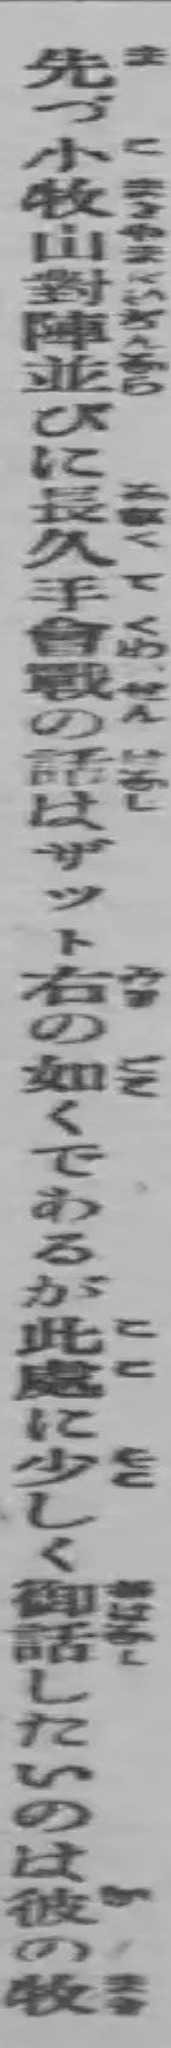先づ小牧山対陣並びに長久手会戦の話はザツト右の如くであるが此処に少しく御話したいのは彼の牧
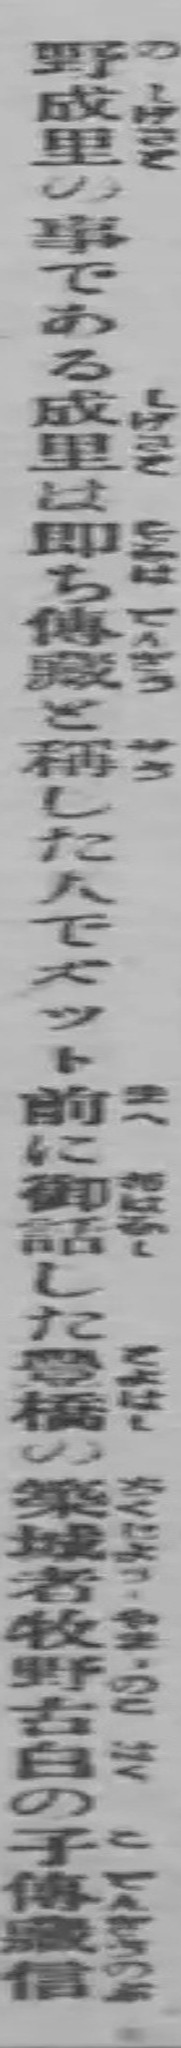野成里の事である茂里は即ち傳蔵と称した人でズツト前に御話した豊橋の築城者牧野古白の子傳蔵信
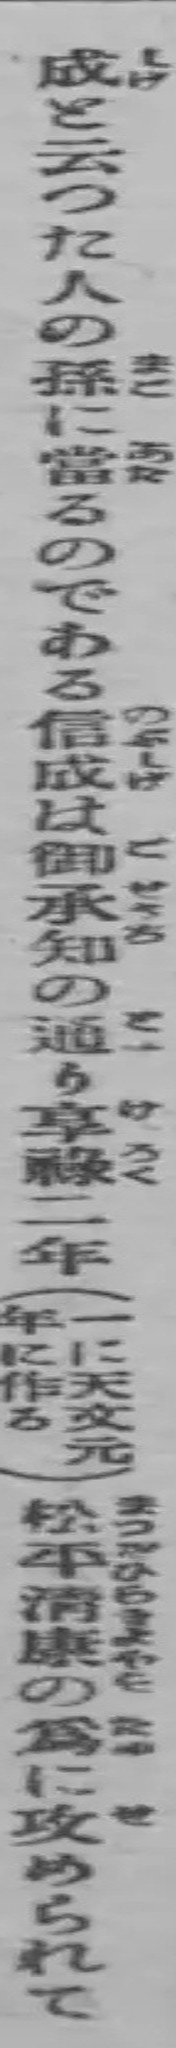成と云つた人の孫に当るのである信成は御承知の通り享禄二年(一に天文元年に作る)松平清康の為に攻められて
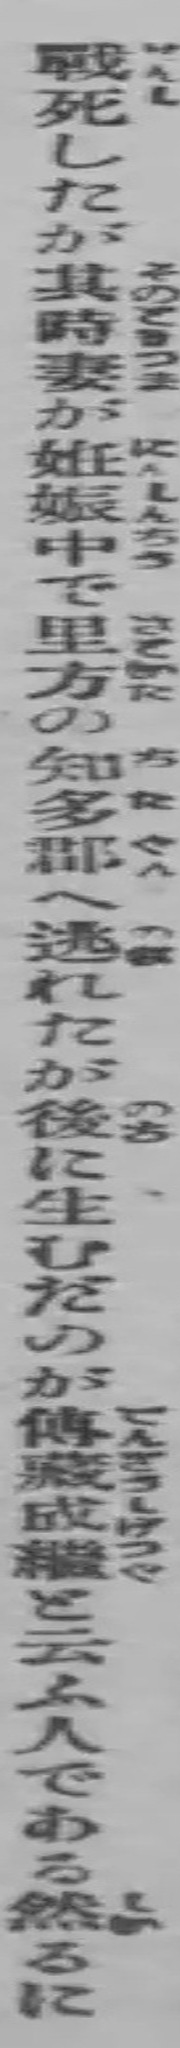戦死したが其時妻が妊娠中で里方の知多郡へ逃れたが後に生むだのが傳蔵成継と云ふ人である然るに
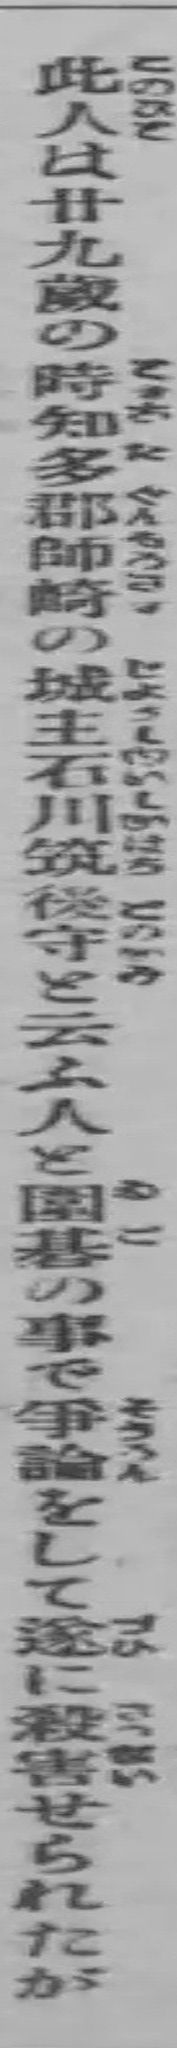此人は廿九歳の時知多郡師崎の城主石川筑後守と云ふ人と囲碁の事で争論をして遂に殺害せられたが
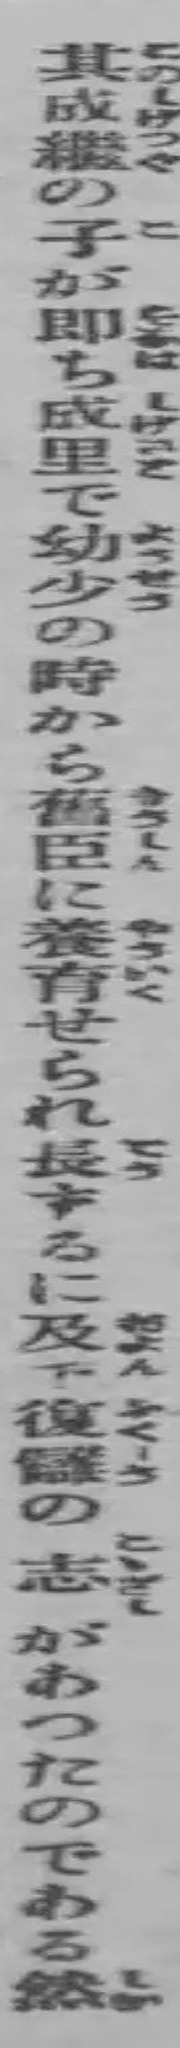其成継の子が即ち成里で幼少の時から旧臣に養育せられ長ずるに及で復讎の志があつたのである然
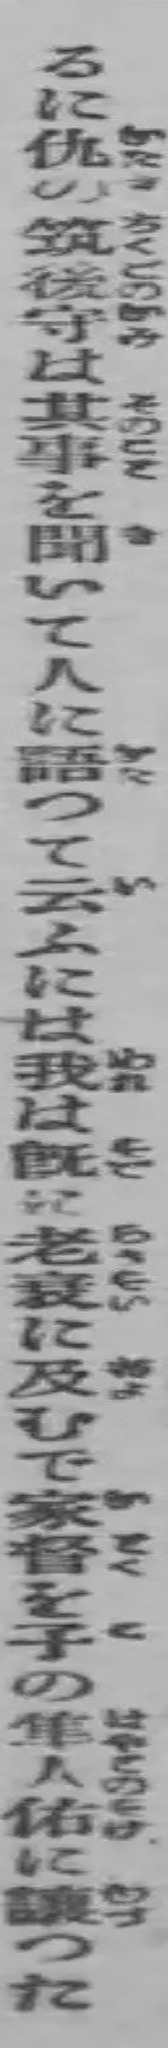るに仇の筑後守は其事を聞いて人に語つて云ふには我は既に老衰に及むで家督を子の隼人佑に譲つた
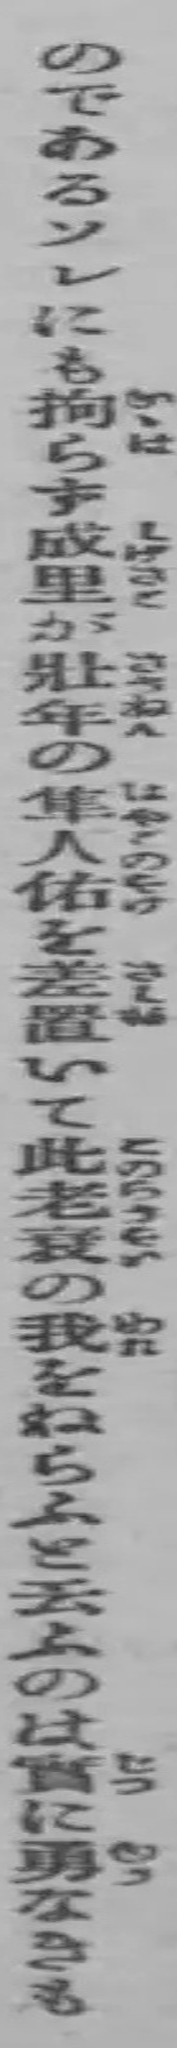のであるソレにも拘らず成里が壮年の隼人佑を差置いて此老衰の我をねらふと云ふのは実に勇なきも
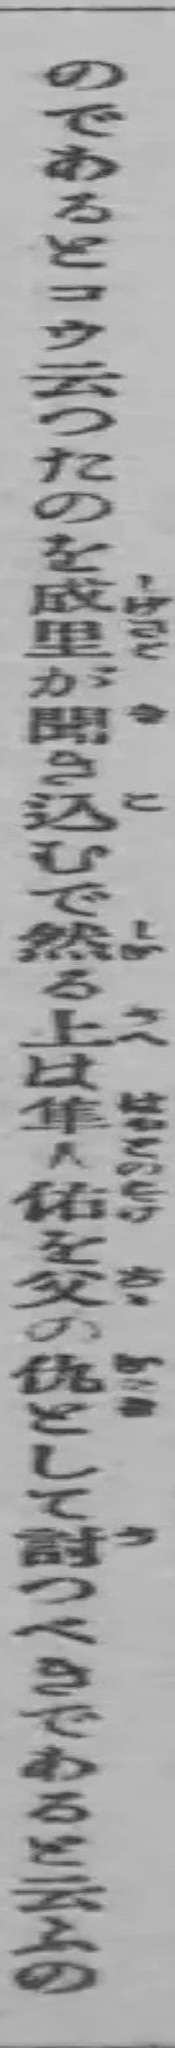のであるとコウ云つたのを成里が聞き込むで然る上は隼人佑を父の仇として討つべきであると云ふの
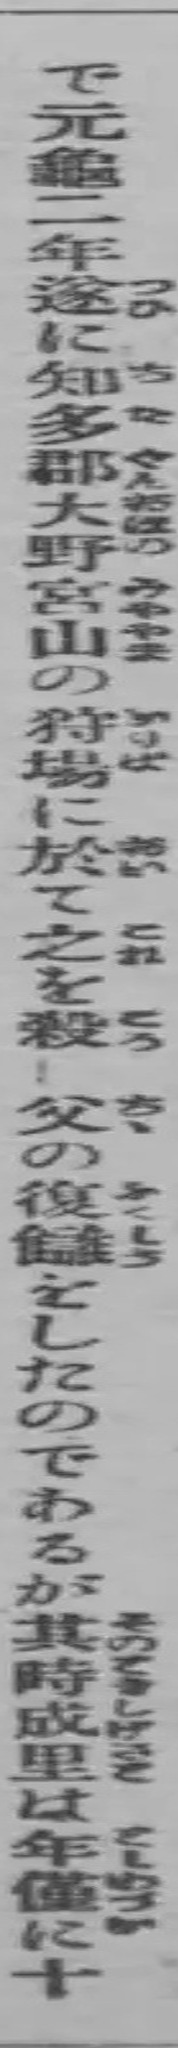で元亀二年遂に知多郡大野宮山の狩場に於て之を殺し父の復讎をしたのであるが其時成里は年僅に十
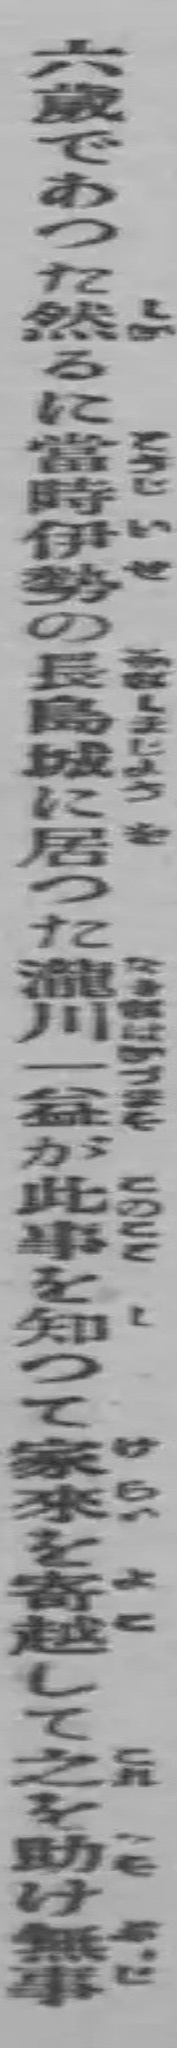六歳であつた然るに当時伊勢の長島城に居つた瀧川一益が此事を知つて家来を寄越して之を助け無事
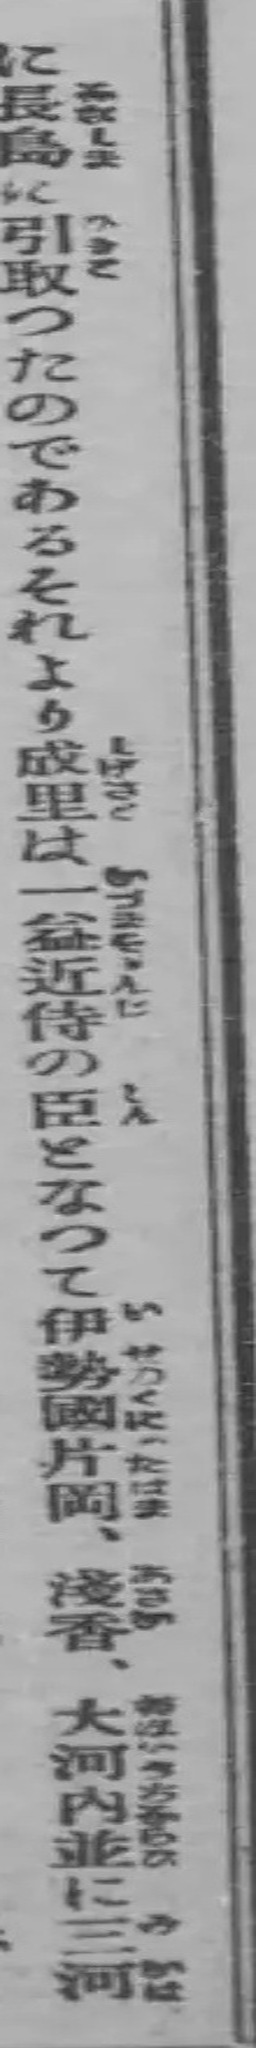に長島に引取つたのであるそれより成里は一益近侍の臣となつて伊勢国片岡、浅香、大河内並に三河
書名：豊橋市史談
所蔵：国立国会図書館 National Diet Library, JAPAN
